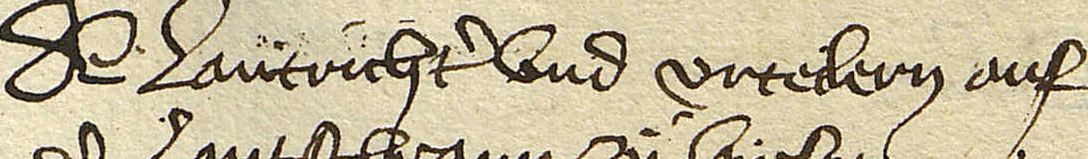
De* Lantricht* vnd vrteilern auf
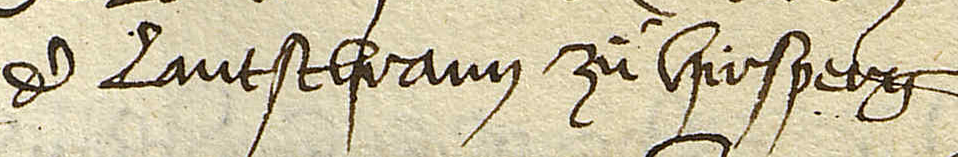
d* Lantſchrann cʒü hirſperg
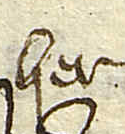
her
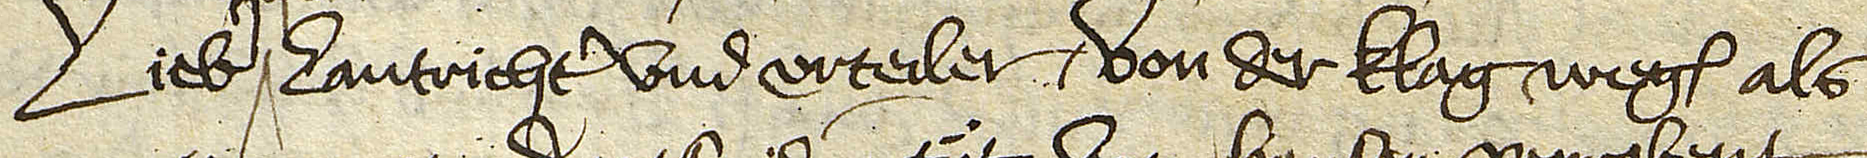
Lieb* Lantricht* vnd vrteiler / Von der klag weg* als
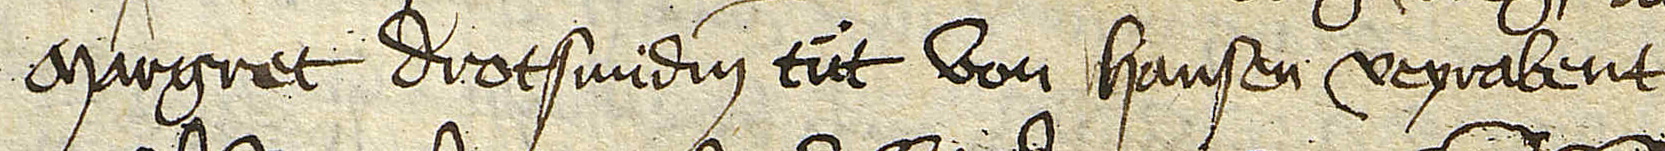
Margret Drotſmidin tüt von hanſen veyrabent
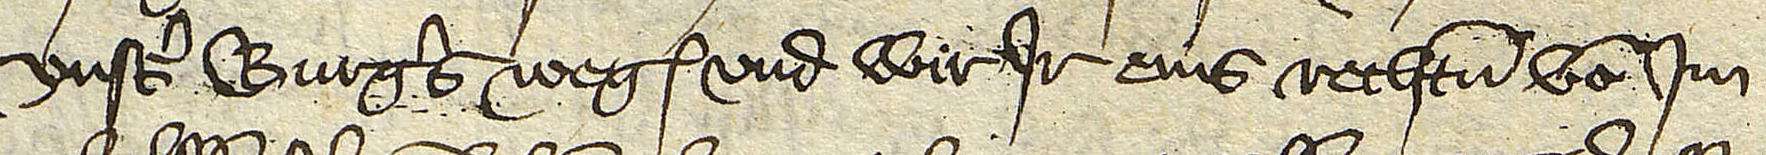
vnſ*s Burg*s weg* vnd wir Ir eins rechtn* vo* Im
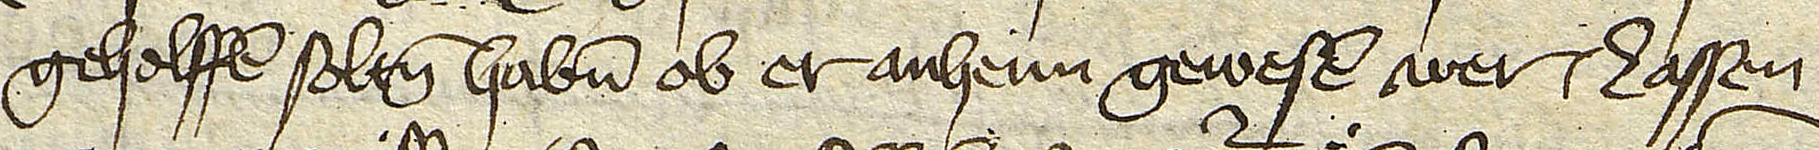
geholffe* ſoltn* habn* ob er anheim geweſe* wer / Laſſen
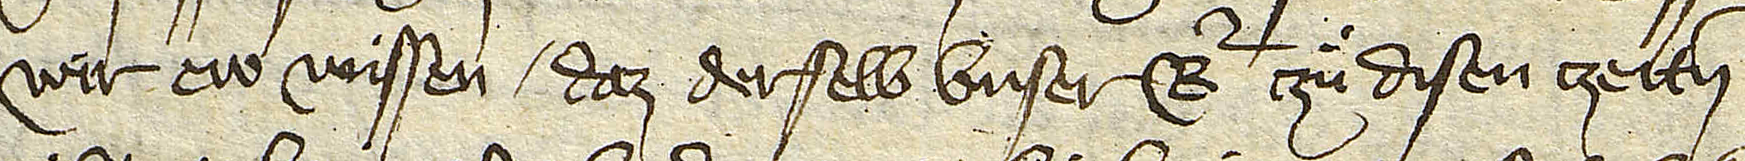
wir ew wiſſen / daʒ derſelb vnſer B* cʒü diſen cʒeitn*
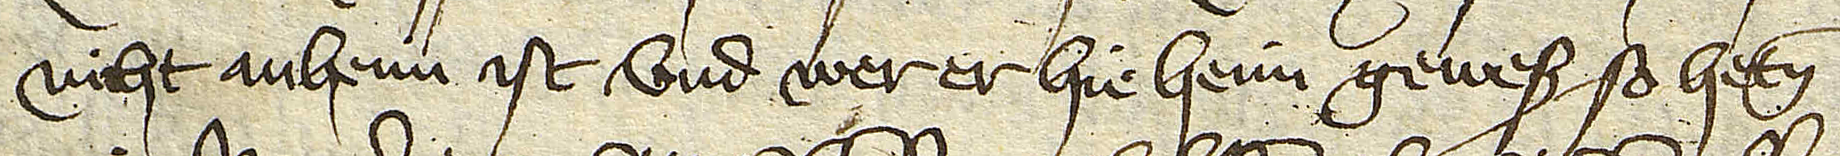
nicht anheim iſt / vnd wer er hie heim geweſ* ſo hetn*
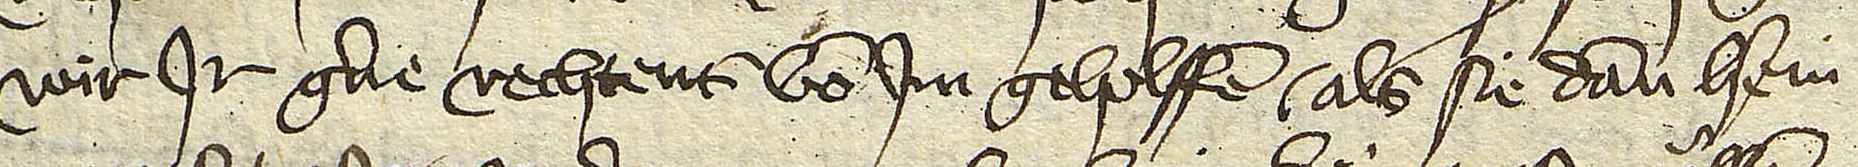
wir Ir g*ne rechtens vo* Im geholffe* / als ſie da*n h*ein
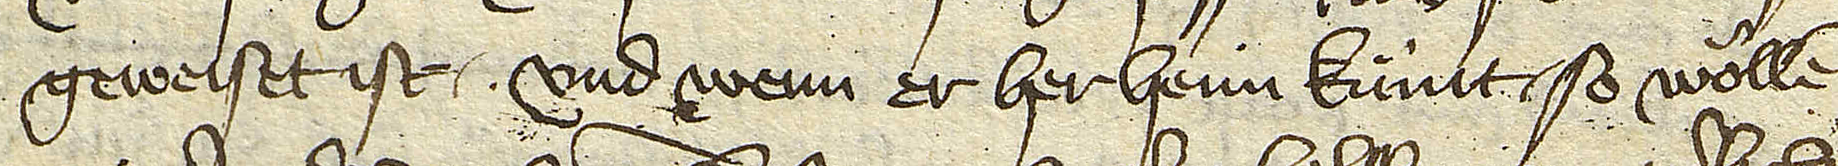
geweiſet iſt / . vnd wenn er her heim kümt / ſo wölle*
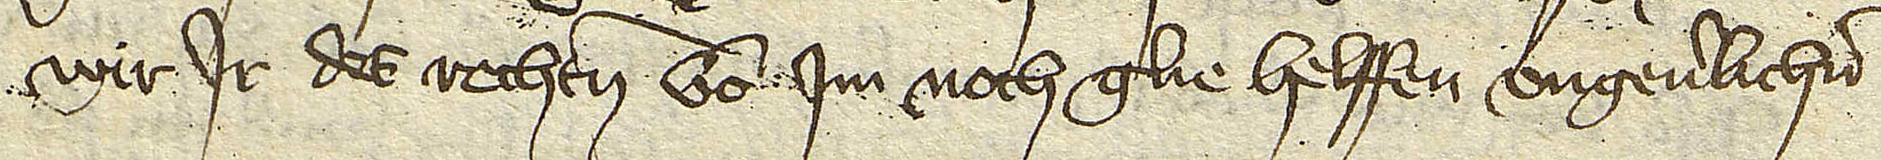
wir Ir des rechtn* vo* Im noch g*ne helffen vngeu*lichn*
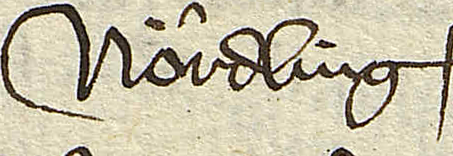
Nördling*
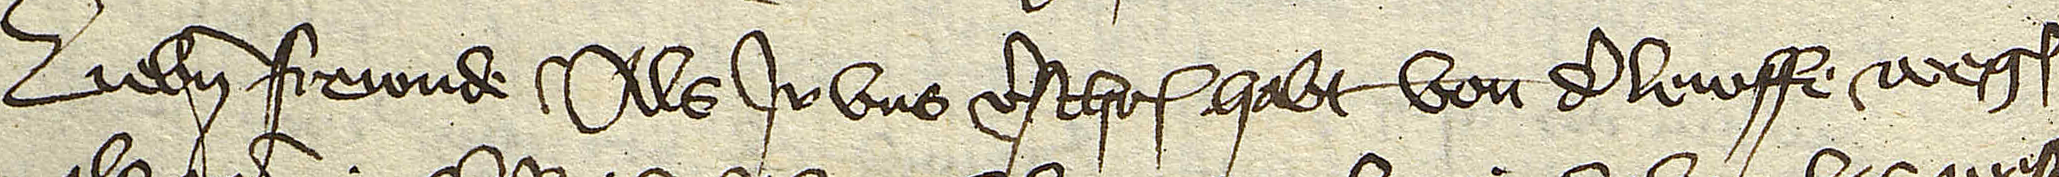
Liebn* frewnde / Als Ir vns v*ſchr* habt von d* lewffe weg*
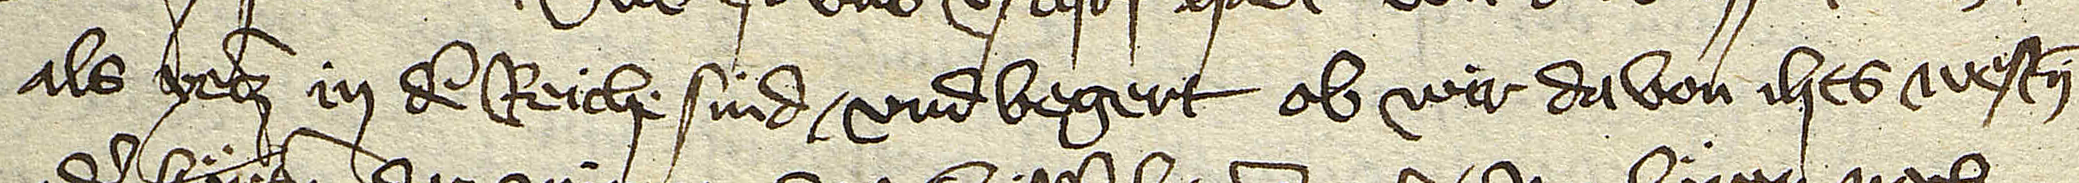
als yecʒ* in d* Reiche ſind / vnd begert ob wir davon ihts weſtn*
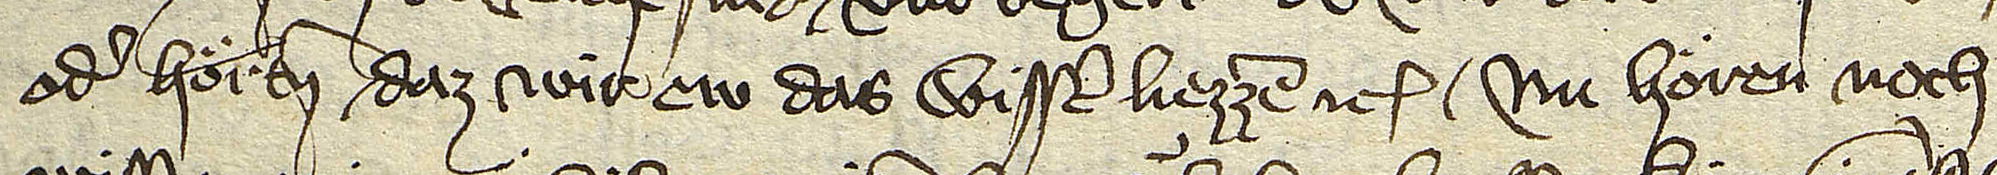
od* hörtn* / daʒ wir ew das wiſſe* lieʒʒe* ec* / Nu hören noch
